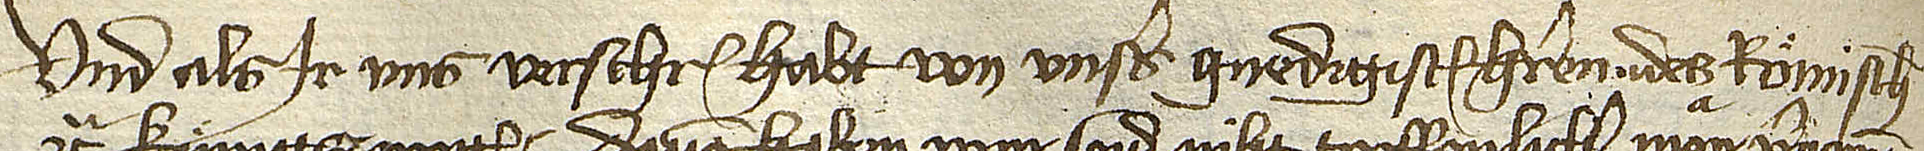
Vnd als Ir vns verſchr* habt von vnſ*s gnedigiſt* hr*en ~ deʒ Römiſch*
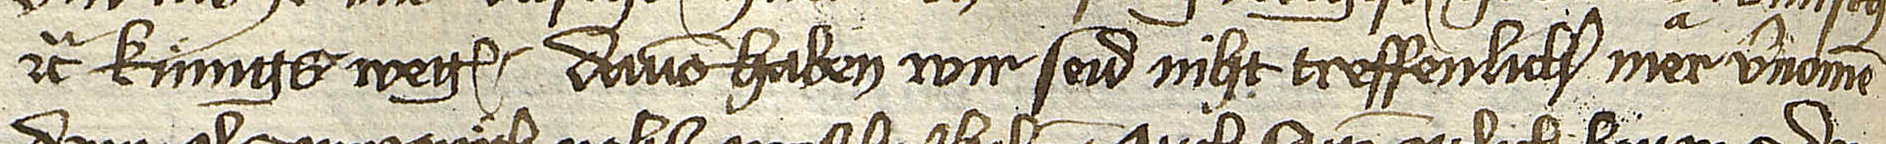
ec* künigs weg* / dauo* haben wir ſeid niht treffenlich* mër v*nome*
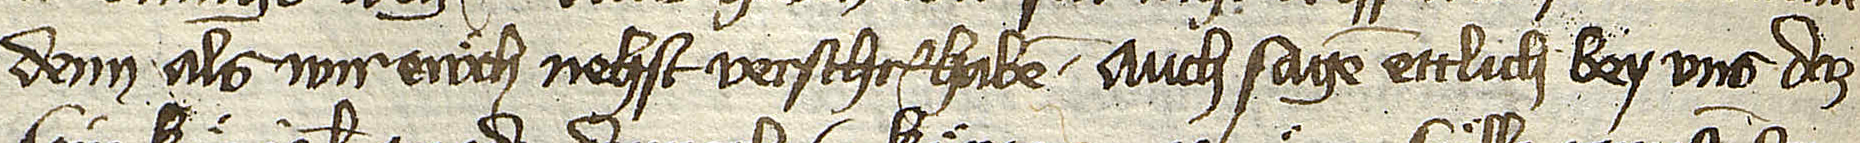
denn . als wir eẅch nehſt verſchr* habe* / auch ſage* ettlich bey vns daʒ
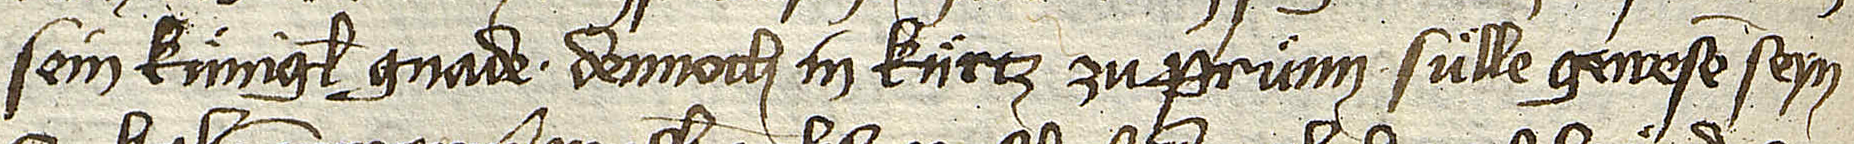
ſein künigl* gnade . dennoch in kürcʒ ʒu Prünn ſülle geweſe* ſeyn
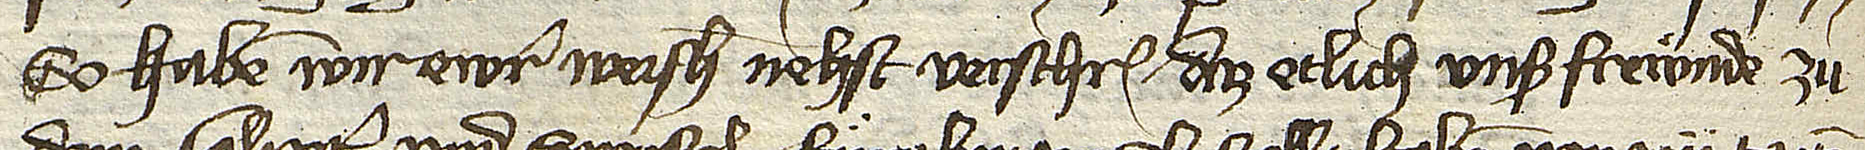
So habe* wir ewr* weiſh* nehſt verſchr* / daʒ etlich vnſ* freẅnde ʒu
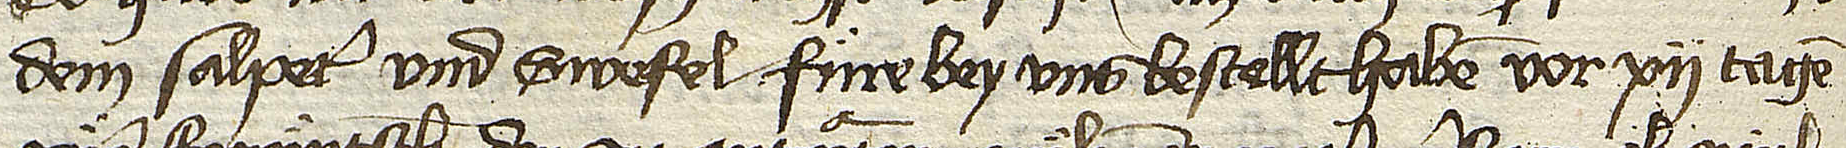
dem ſalpet* vnd Swefel füre bey vns beſtellt habe* vor xii tage*
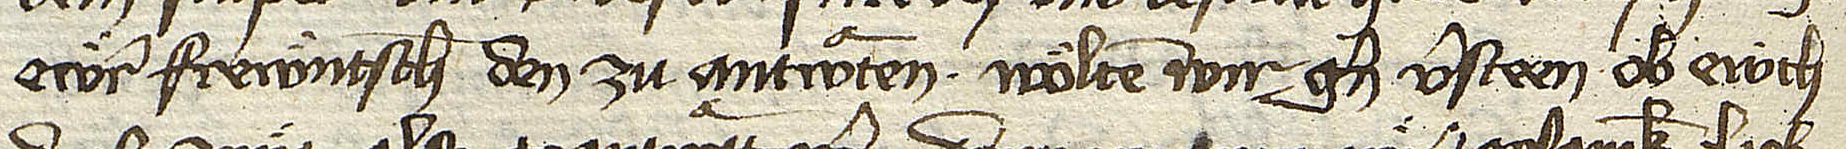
eẅr* freẅntſch* den ʒu antw*ten . wölte* wir g*n v*ſteen ob eẅch
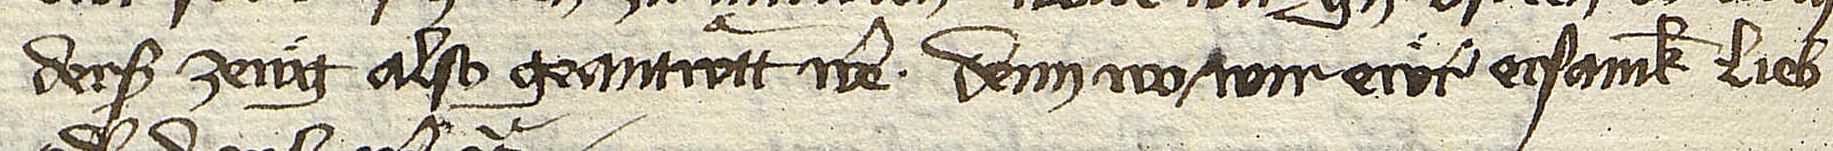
derſ* ʒeẅg alſo geantw*tt we* . Denn wo wir eẅr* erſamk* lieb
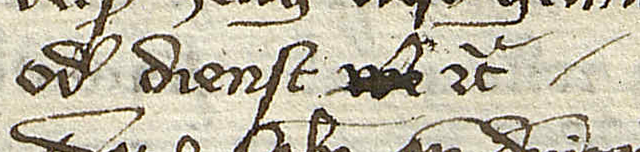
od* dienſt we* ec* /
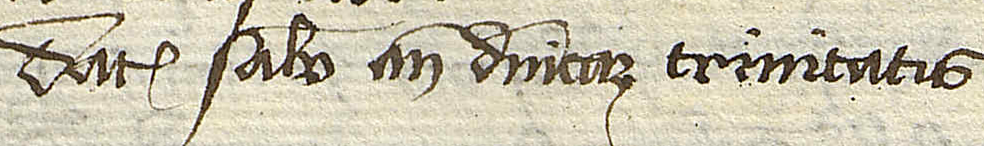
Dat* ſabo* an dnica* trinitatis
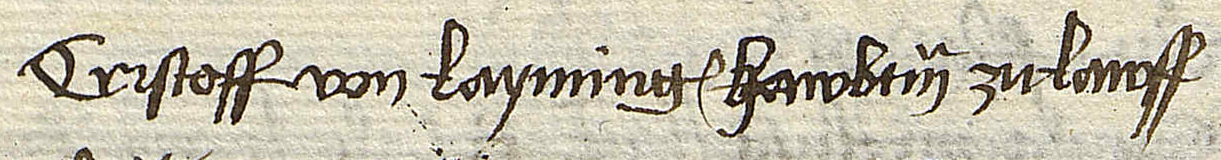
Criſtoff von layming* hawbtm* ʒu lawff
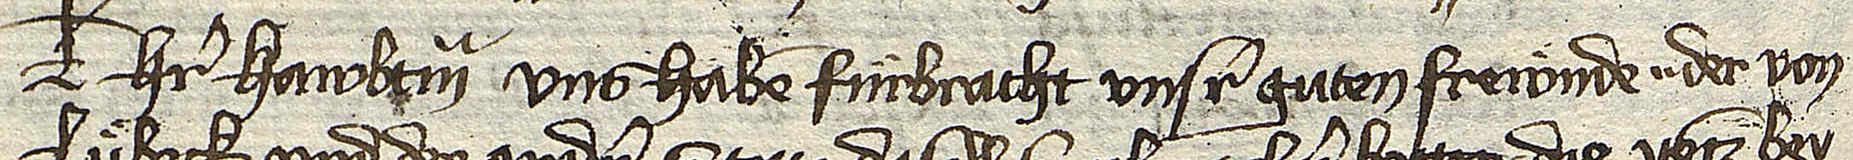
L* hr* hawbtm* vns habe* fürbracht vnſ*r guten freẅnde ~ der von
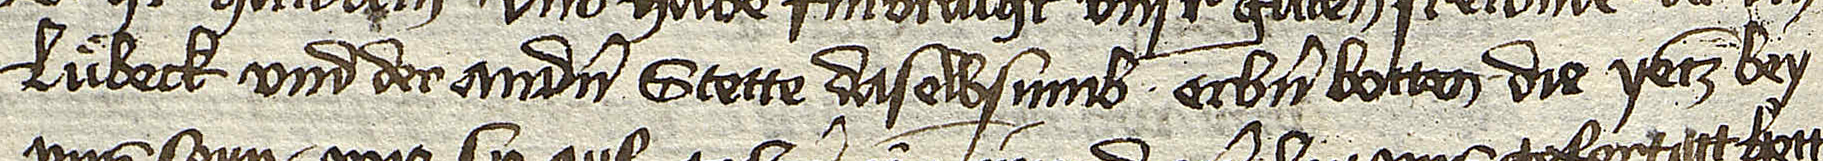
Lübeck vnd der and*n stette daſelbſumb . erb*n botten . die yecʒ bey
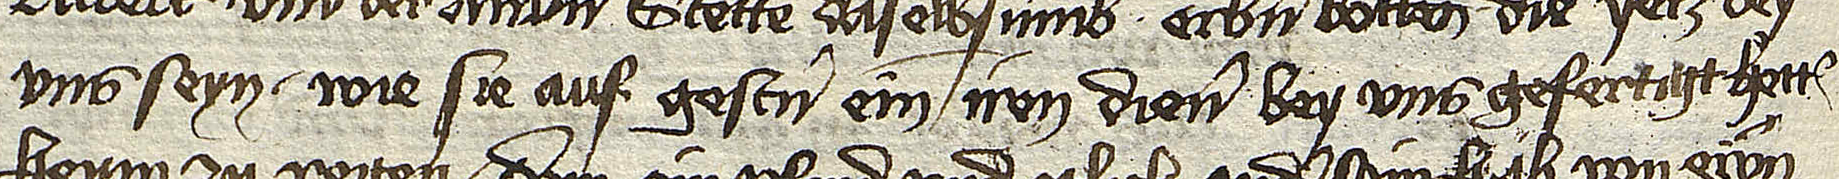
vns ſeyn / wie ſie auf geſt*n ein iren dien* bey vns gefertigt hett*
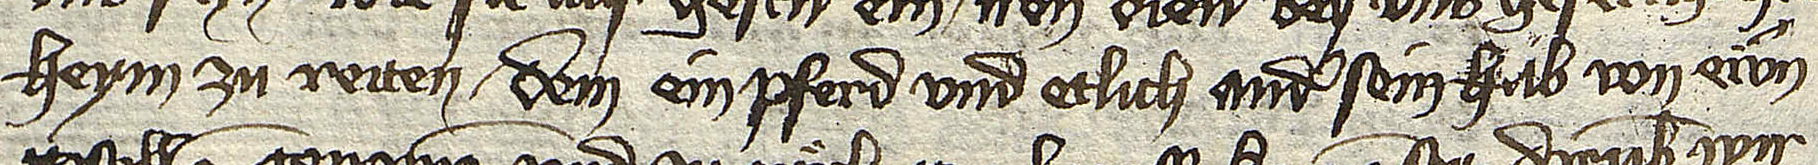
heym ʒu reiten / Dem ein pferd vnd etlich and* ſein hab von eẅ*n
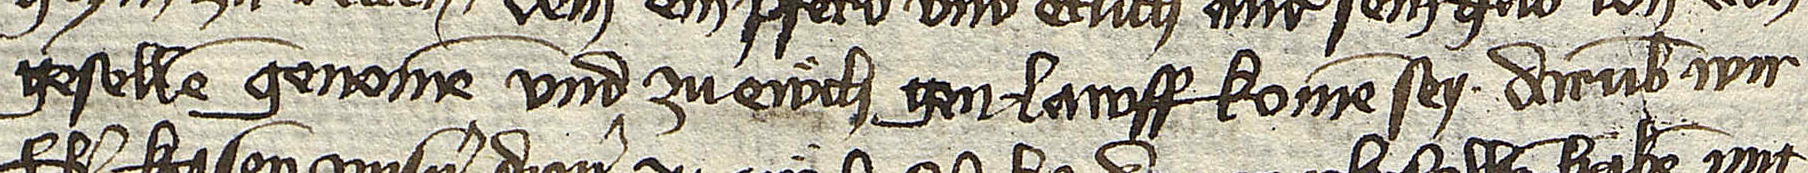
geſelle* genome* vnd ʒu eẅch gen lawff kome* ſey . darub* wir
